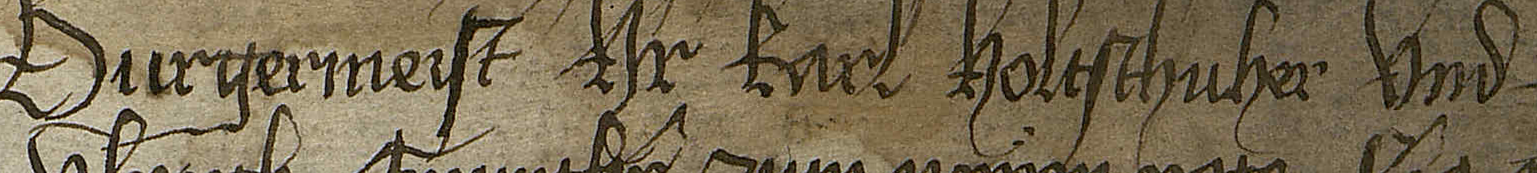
Burgermeiſ* Hr* Karl Holtſchuher Vnd Hr*
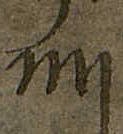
iiii*
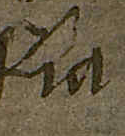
fi*a
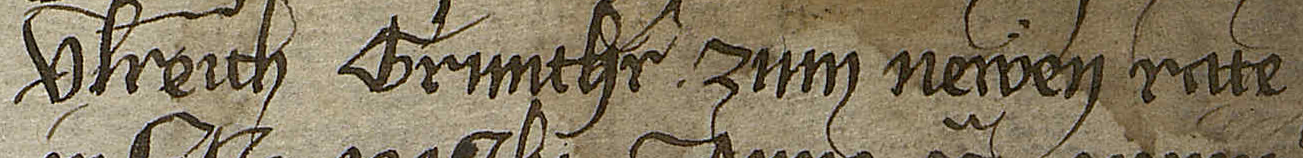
Vlreich Grunthr* ʒum neẅen rate
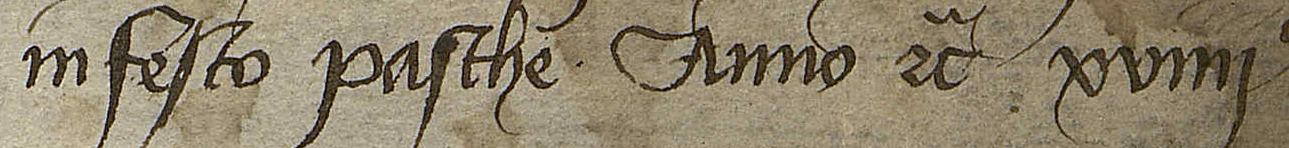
in feſto paſche Anno ec* xviiii*
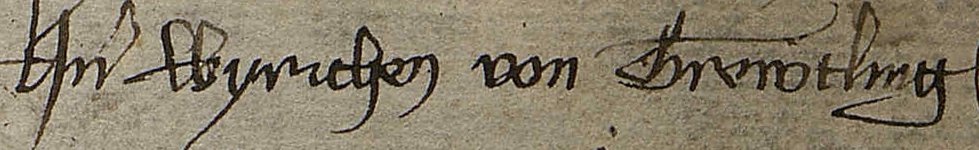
Hn* Wyrichen von Trewtling*
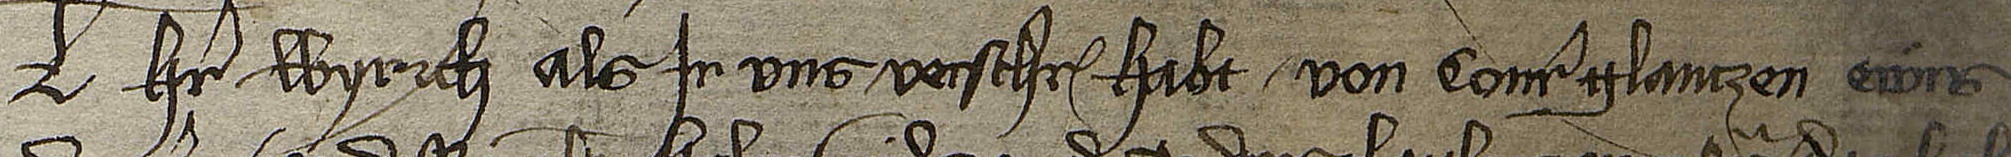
L* hr* Wyrich als Ir vns verſchr* habt / von Conr* glancʒen eẅrs
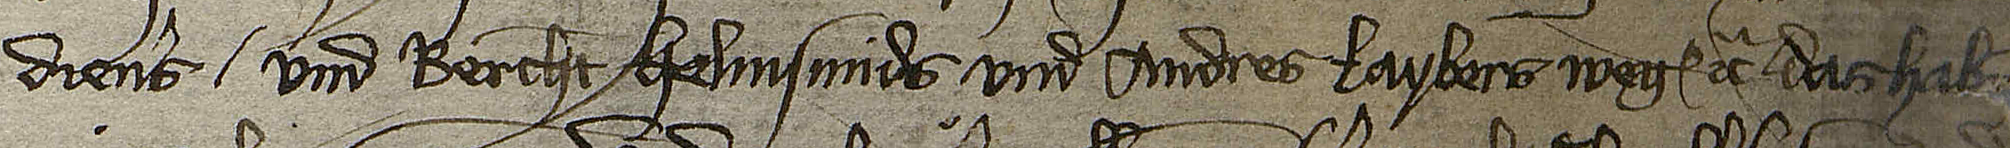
dien*s / vnd Bercht* helmſmids vnd Andres laybers weg* ec* / das habn*
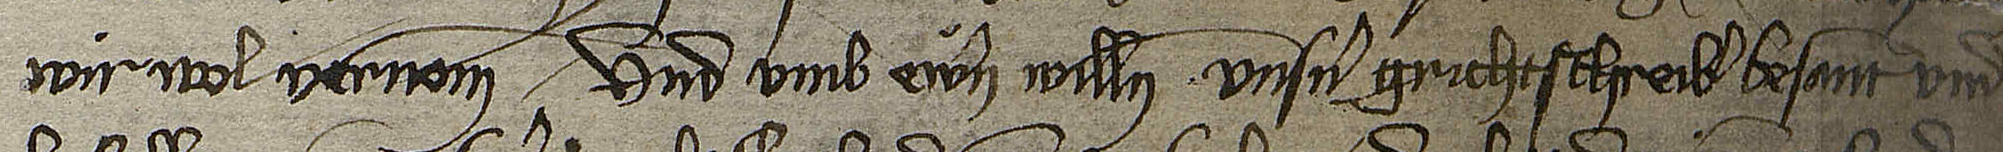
wir wol vernom* / Vnd vmb eẅ*n willn* . vnſn* grichtſchreib* beſant vnd
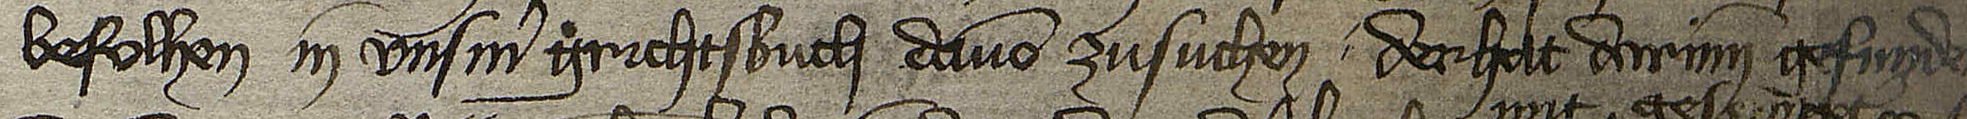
befolhen in vnſm* grichtſbuch dauo* ʒuſuchen / der hat darinn* gefunden
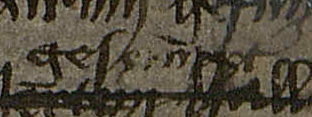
geſeinpot*
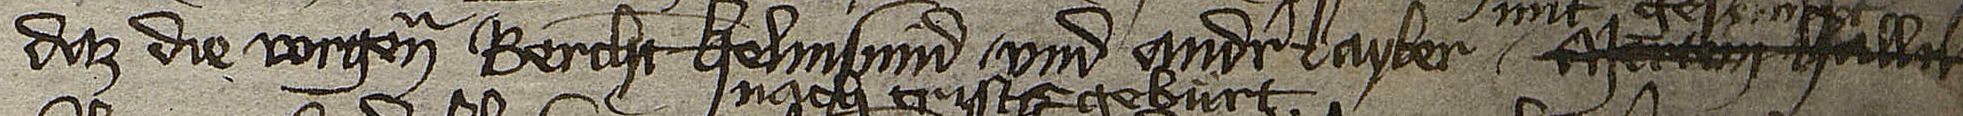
daʒ die vorgen* Bercht* helmſmid / vnd andr* layber / Mertein halln*
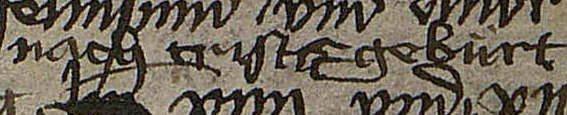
nach criſts gebürt
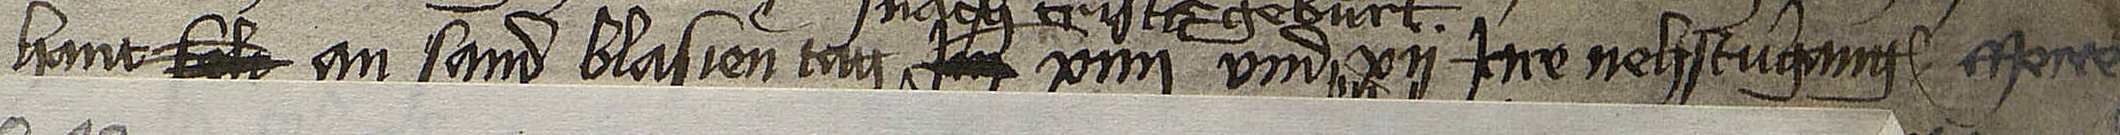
hant %% an ſand blaſien tag Im* xiiii vnd xii Iare nehſtu*gang* Merteins
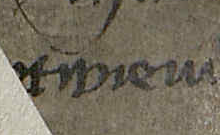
etwieuil
